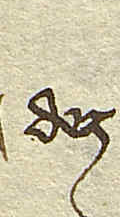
deʒ
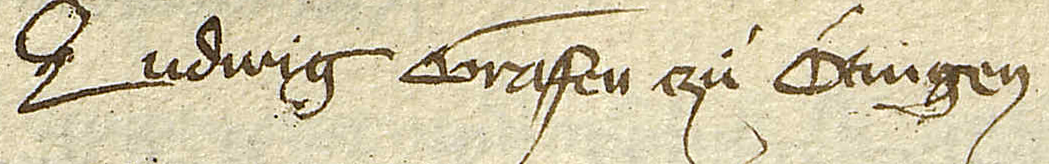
Ludwig Grafen cʒü Ötingen
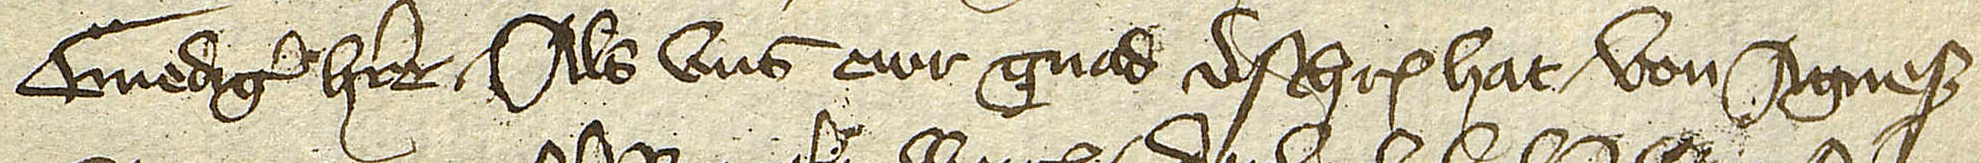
Gnedig* hr*e / Als vns ewr gnad v*ſchr* hat / von Agneſʒ
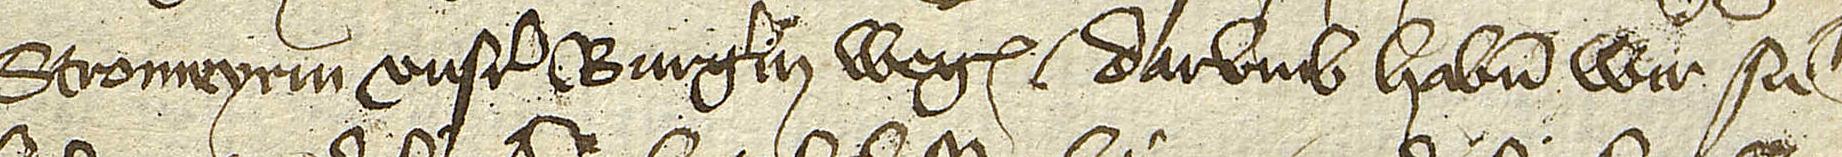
Stromeyrin vnſr* Burg*in weg* / Darvmb habn* wir ſie
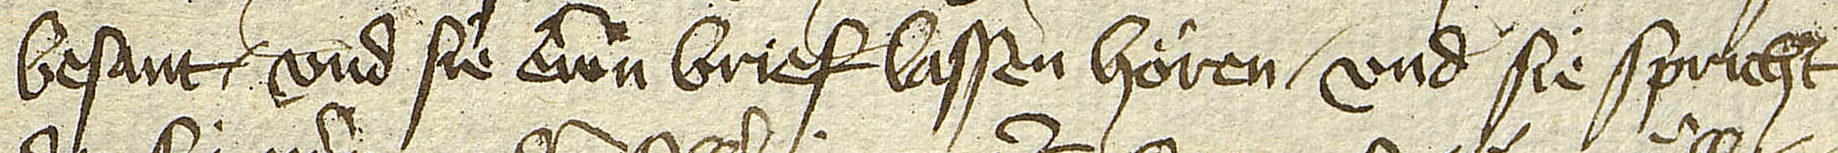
beſant / vnd ſie ewn* brief laſſen hören / vnd ſie ſpricht
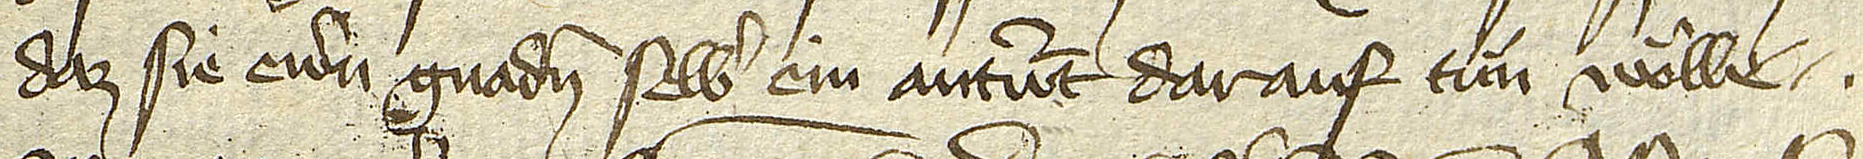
daʒ ſie ew*n gnadn* ſelb* ein antwt* darauf tün wölle /.
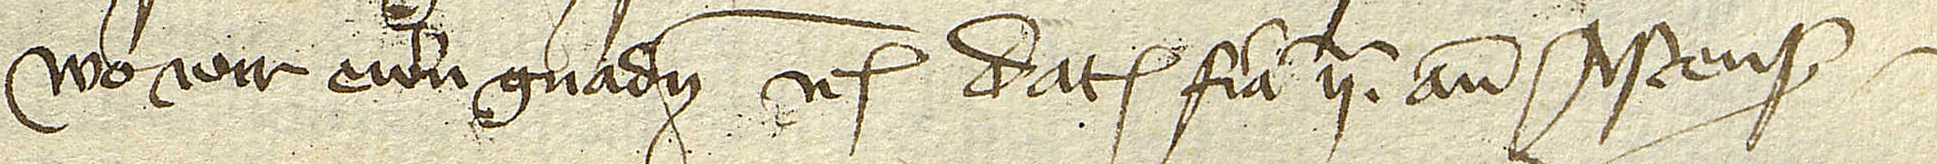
wo wir ew*n gnadn* ec* Dat* fia* ii*. an* Aſcenſ* /
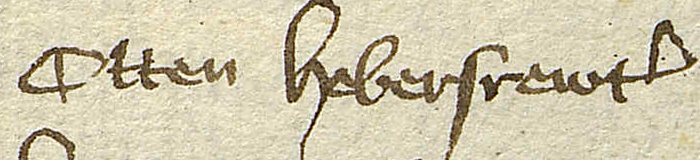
Otten Heberſrewt*
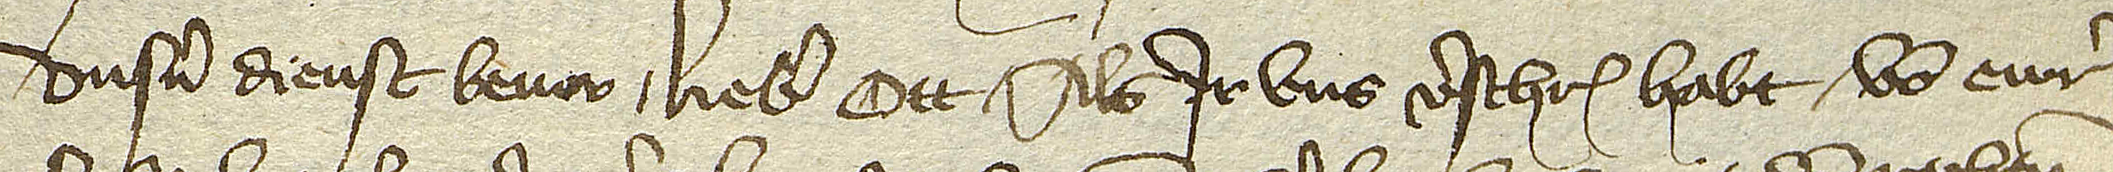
Vnſn* dienſt beuor / lieb* Ott / Als Ir vns v*ſchr* habt / vo* ewr*
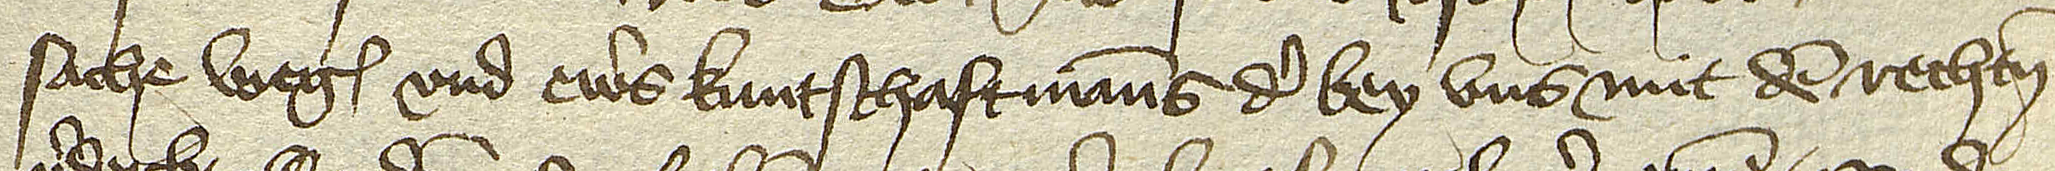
ſache weg* vnd ew*s kuntſchaftman*s d* bey vns mit d* rechtn*
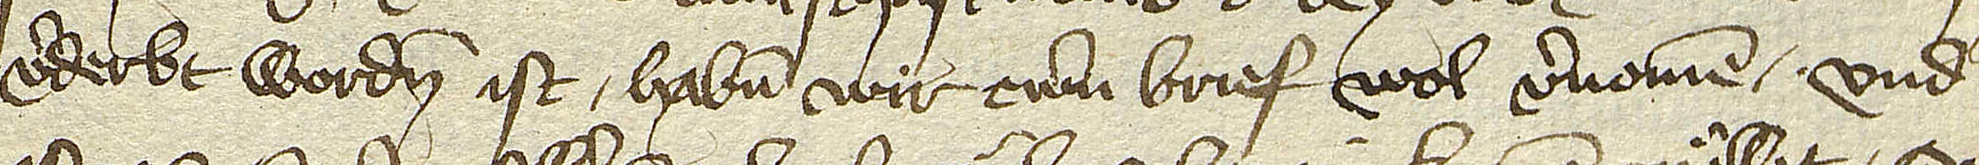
v*derbt wordn* iſt / habn* wir ew*n brief wol v*nome* / . vnd
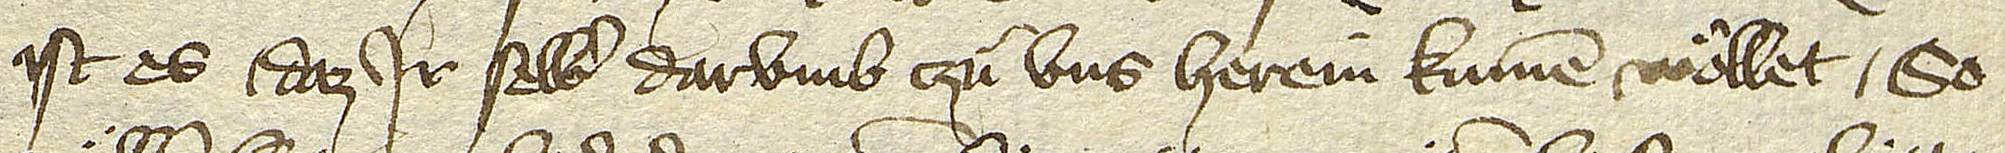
iſt es / daʒ Ir ſelb* darvmb cʒü vns herein kume* wöllet / So
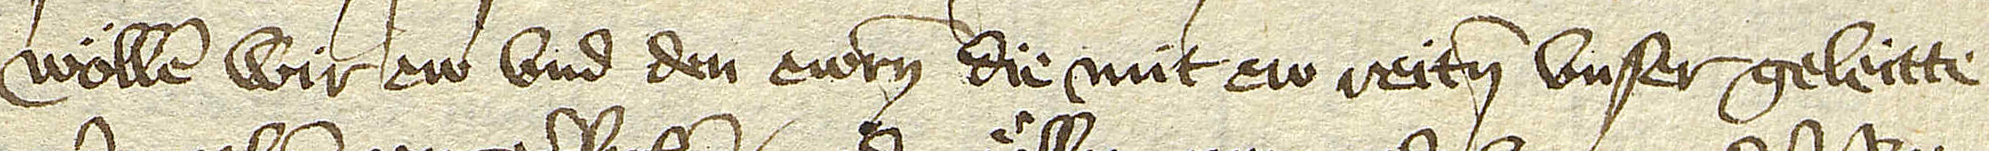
wölle* wir ew vnd den ewrn* die mit ew reitn* vnſer geleitte
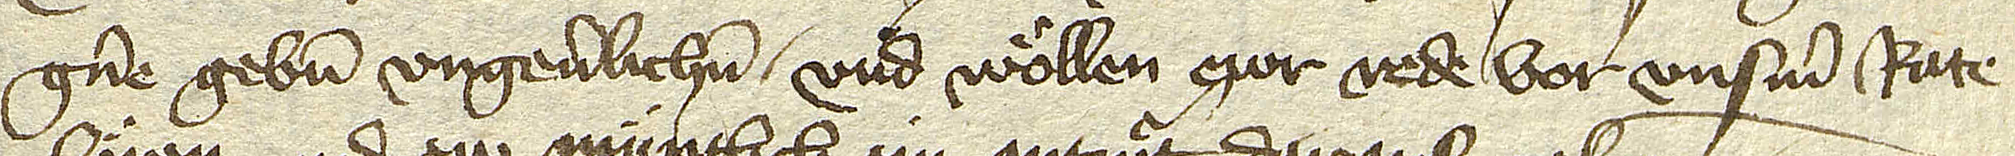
gn*e gebn* vngeu*lichn* / vnd wöllen ewr rede vor vnſm* Rate
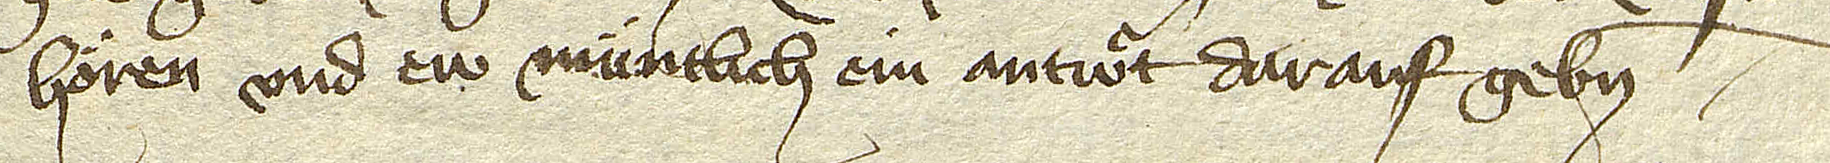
hören vnd ew müntlich ein antwt* garauf gebn* /
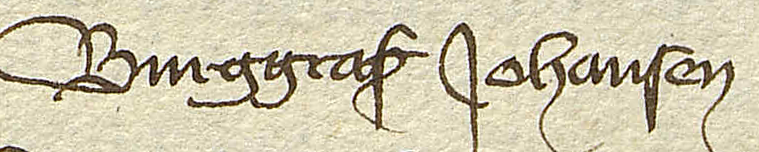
Burggraf* Iohanſen
